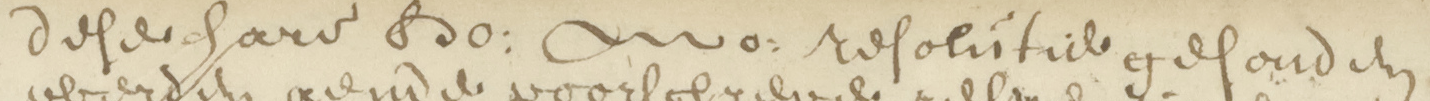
dese hare Ho:Mo: resolutie gesonden
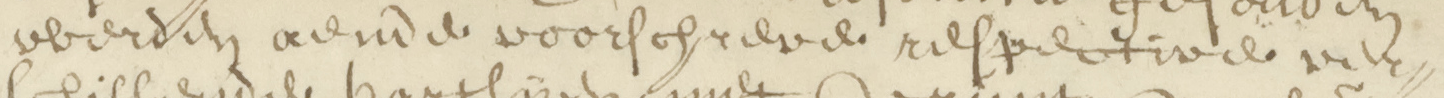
werden aende voorschreve respective ver„
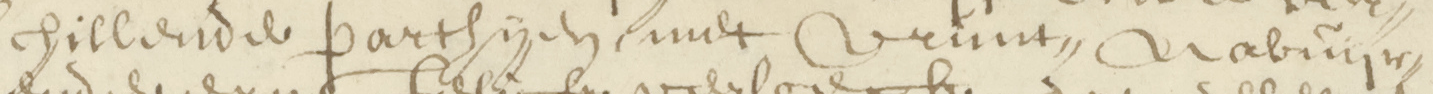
schillende parthijen, met vrunt,, nabuijr„
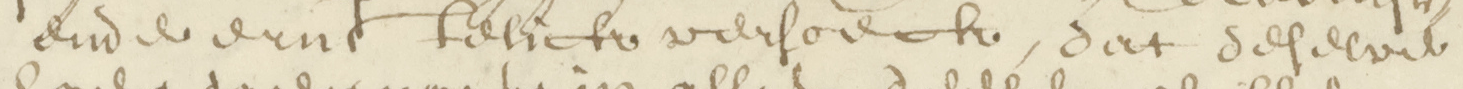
ende ernstelick versoeck, dat deselve
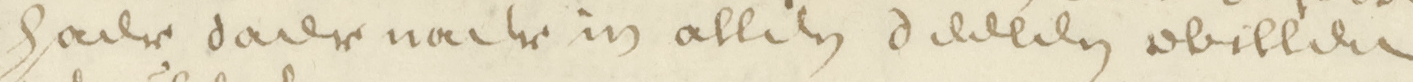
haer daer naer in allen deelen willen
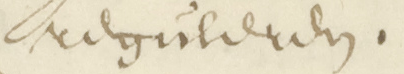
reguleren.
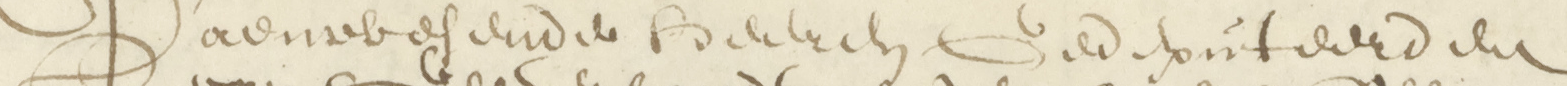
D'aenwesende Heeren Gedeputeerden
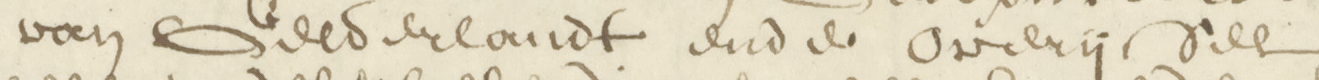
van Gelderlandt ende Overijssel
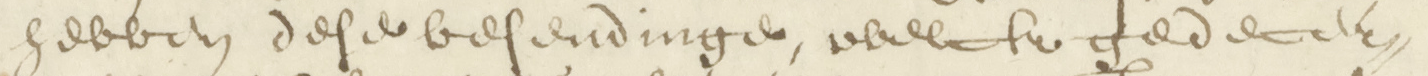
hebben dese besendinge, welck gedecer„
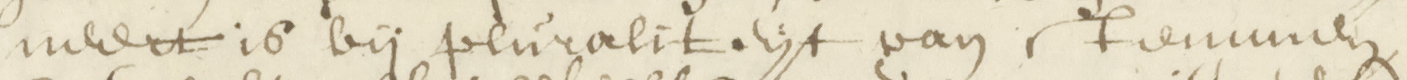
neert is bij pluraliteijt van stemmen.
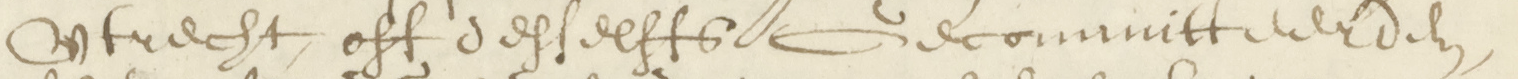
Utrecht, off desselffs Gecommitteerden,
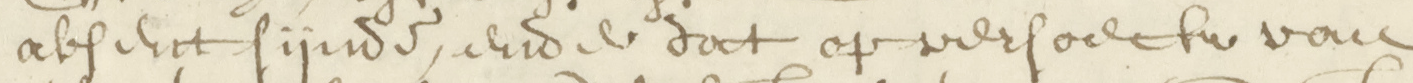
absent sijnde, ende dat op versoeck van
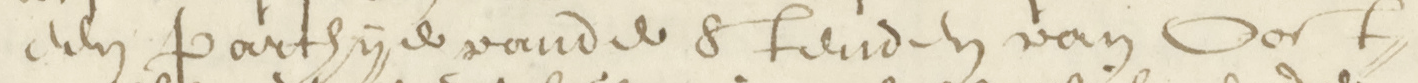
een parthije vande Stenden van Oost„
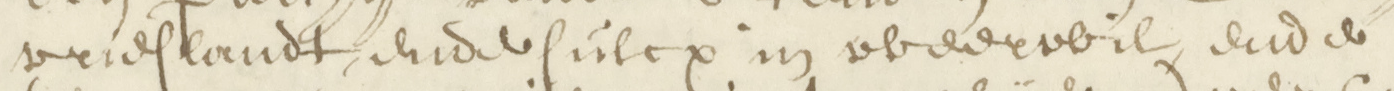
vrieslandt, ende sulcx in weerwil, ende
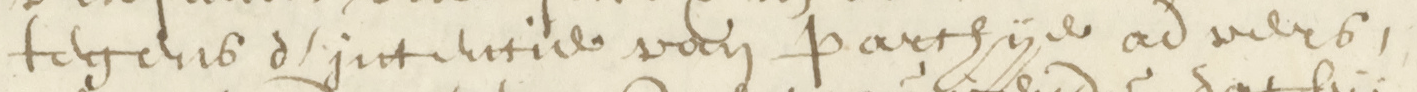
tegens d'intentie van parthije advers,
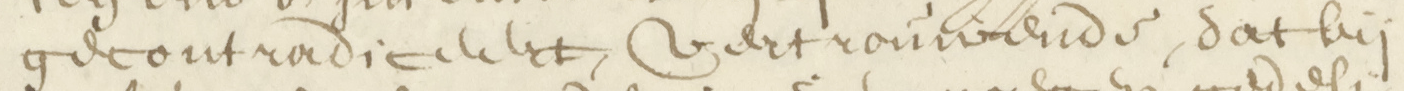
gecontradiceert, vertrouwende, dat bij
